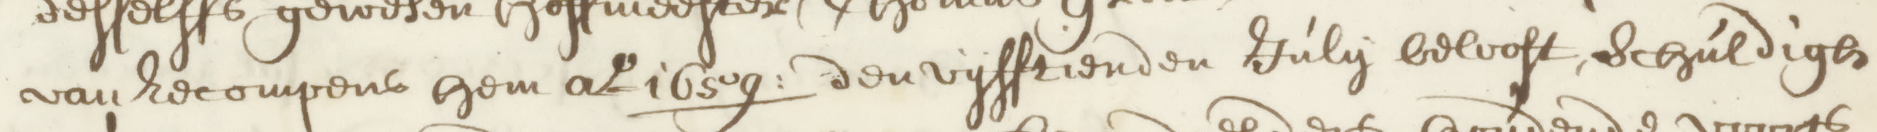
van recompens hem ao 1659: den vijfftienden Julij belooft, Schuldigh
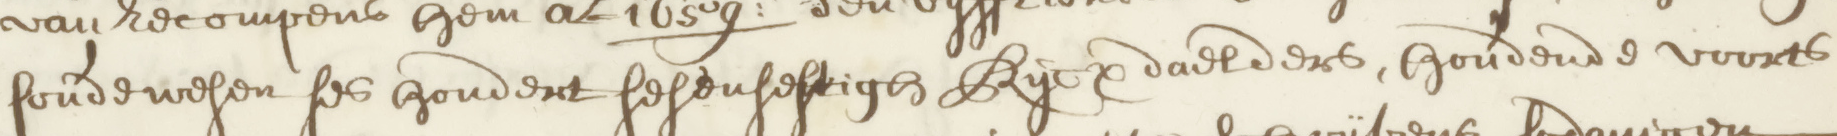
soude wesen ses hondert sesensestigh Rijcxdaelders, houdende voorts
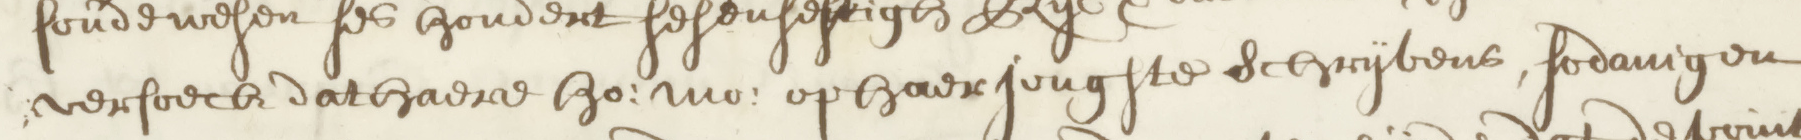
versoeck dat haere Ho:Mo: op haer jongste schrijvens, sodanigen
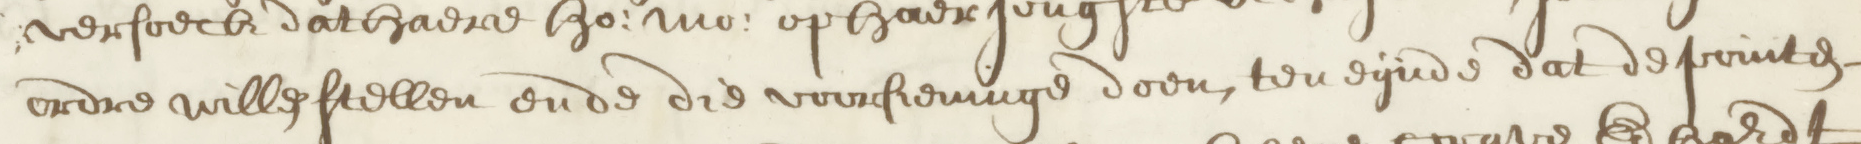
ordre wille stellen ende die voorsieninge doen, ten eijnde dat de pointen
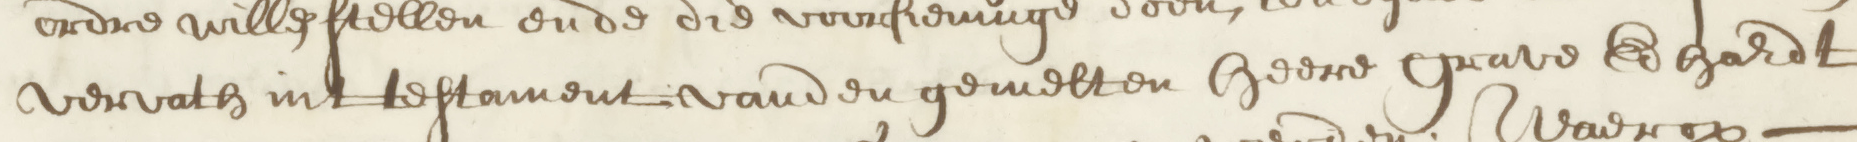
vervath int testament vanden gemelten Heere Grave Edhardt
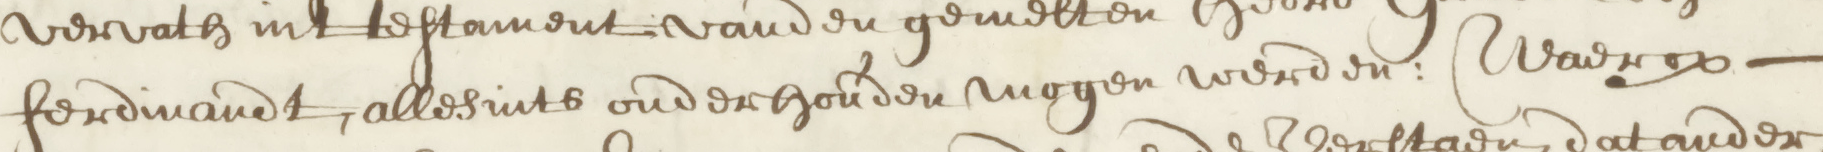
ferdinandt, allesints onderhouden mogen werden: Waerop —
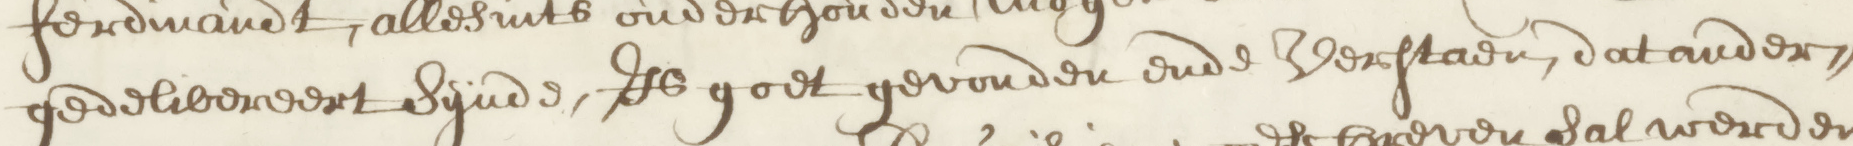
gedelibereert Sijnde: Is goet gevonden ende Verstaen, dat ander„
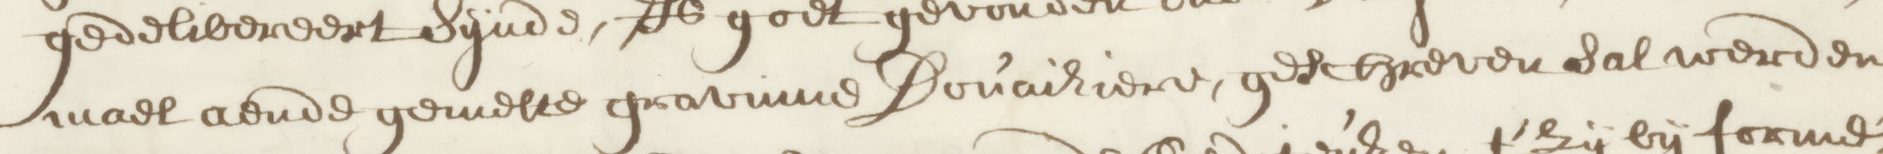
mael aende gemelte gravinne Douairiere, geschreven sal werden
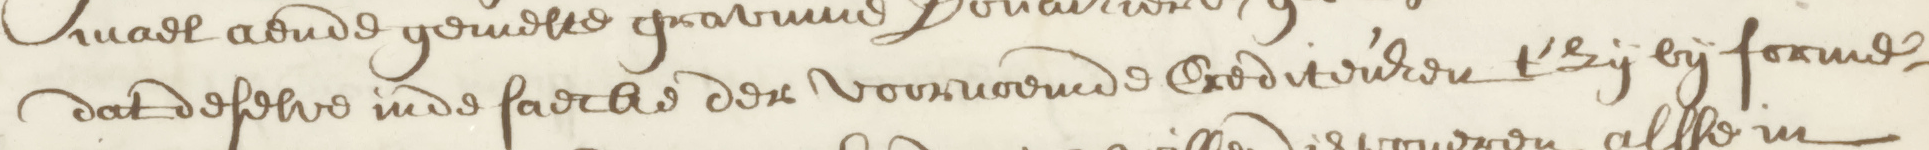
dat deselve inde saecke der voornoemde Crediteuren t'zij bij forme
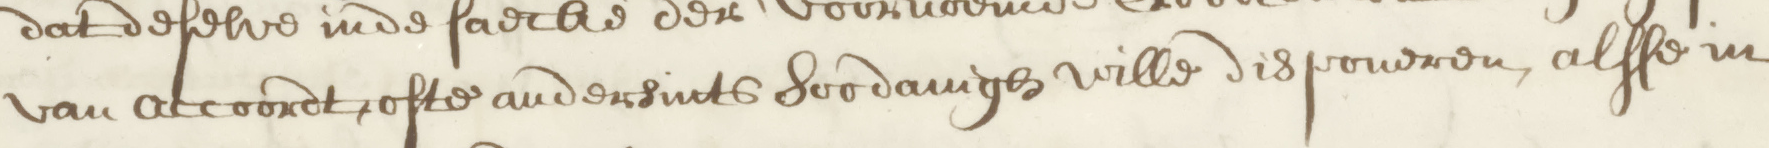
van accoordt, ofte andersints soodanigh wille disponeren, alsse in —
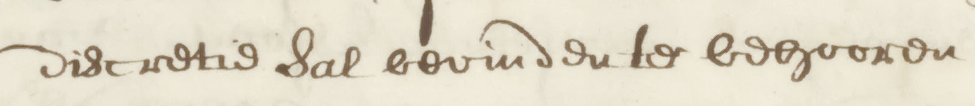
discretie sal bevinden te behooren.
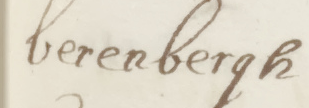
berenbergh.
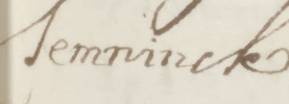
Temninck.
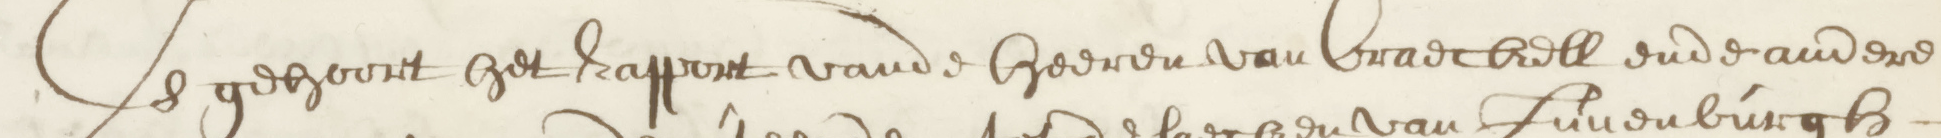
Is gehoort het rapport vande Heeren van Braeckell ende andere
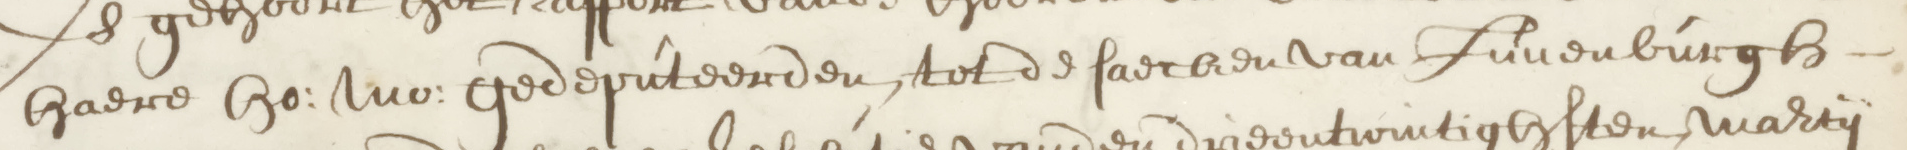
haere Ho:Mo: gedeputeerden, tot de saecken van Lunenburgh —
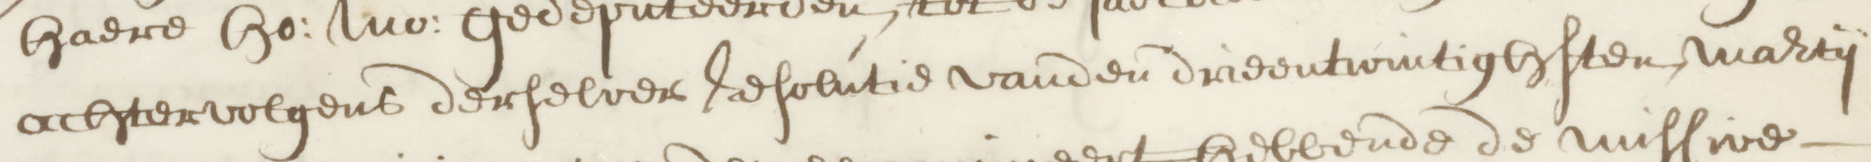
achtervolgens derselver resolutie vanden drieentwintighsten, martij
